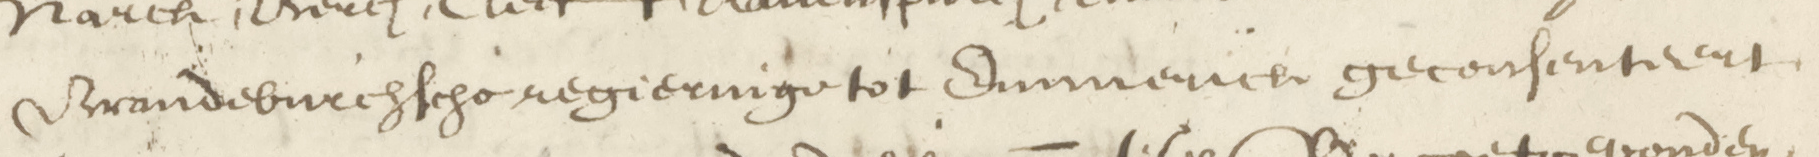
Brandeburchsche regieringe tot Emmerick geconsenteert,
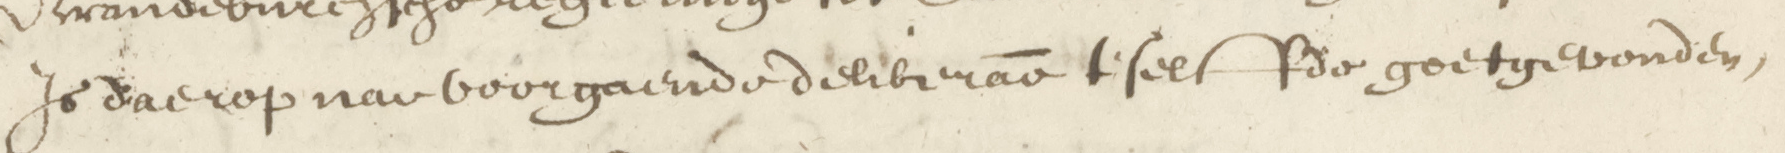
Is daerop nae voorgaende deliberae t'selffde goetgevonden.
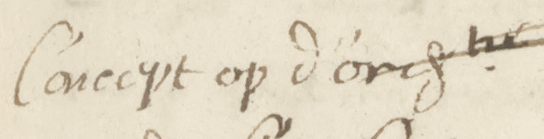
Concept op d'ordtie.
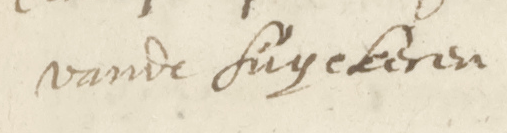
vande suyckeren
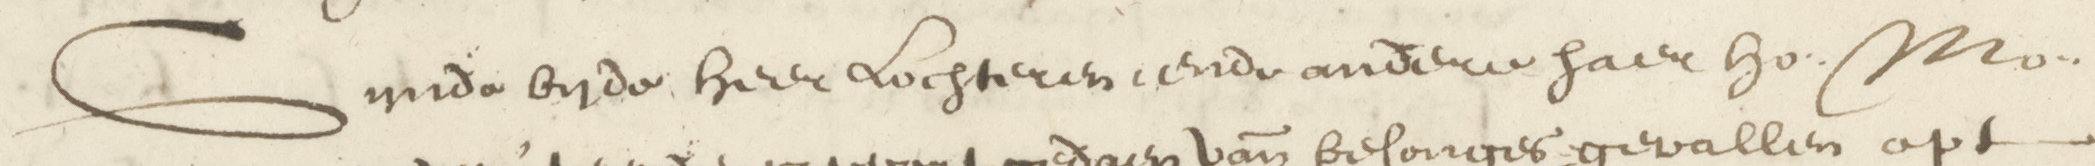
Synde byde heer Lochteren, ende andere haer Ho:Mo:
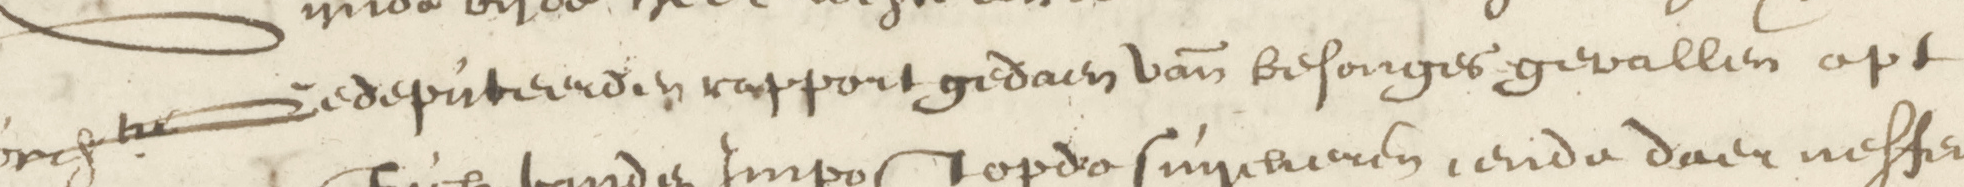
Gedeputeerden rapport gedaen van besonges gevallen opt
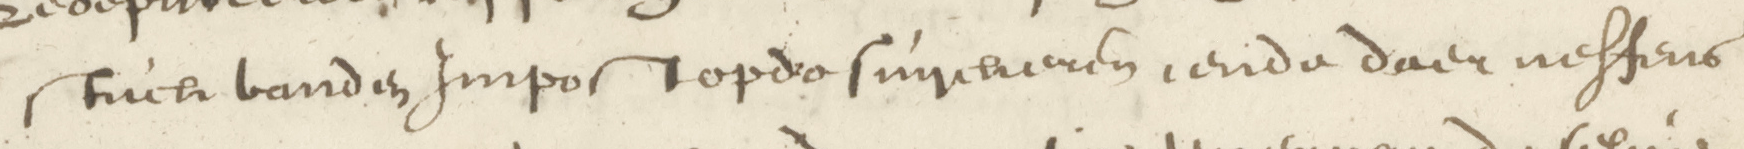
stuck vanden Impost opde suyckeren, ende daer neffens
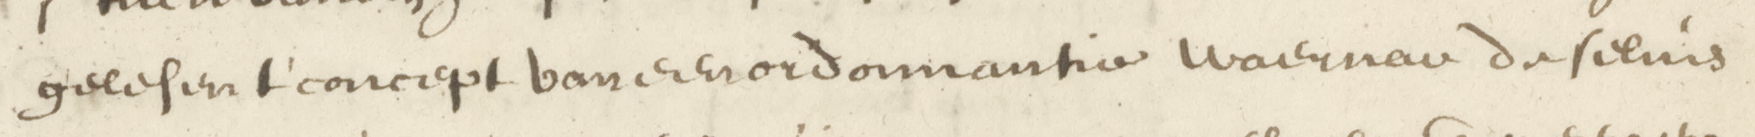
gelesen t' concept van een ordonnantie waernae deselven
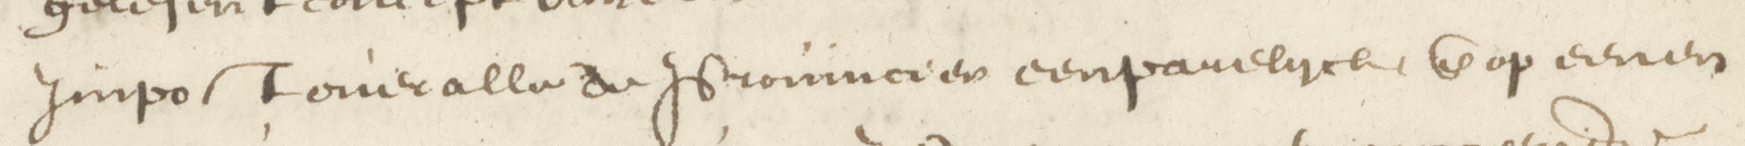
Impost ouer alle de Prouincien eenparelyck & op eenen
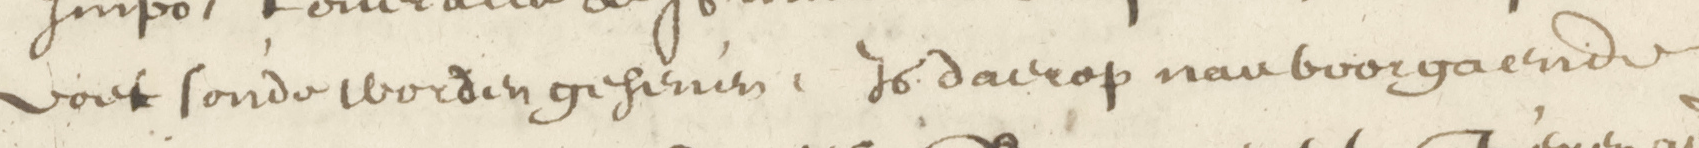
voet soude worden geheuen. Is daerop nae voorgaende
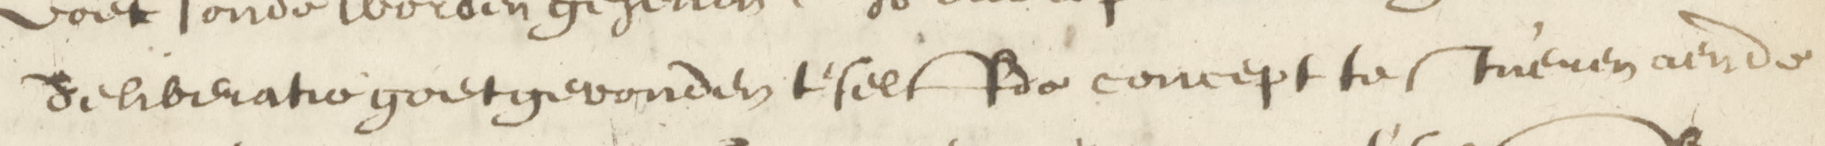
deliberatie goetgevonden t'selffde concept te stueren aen de
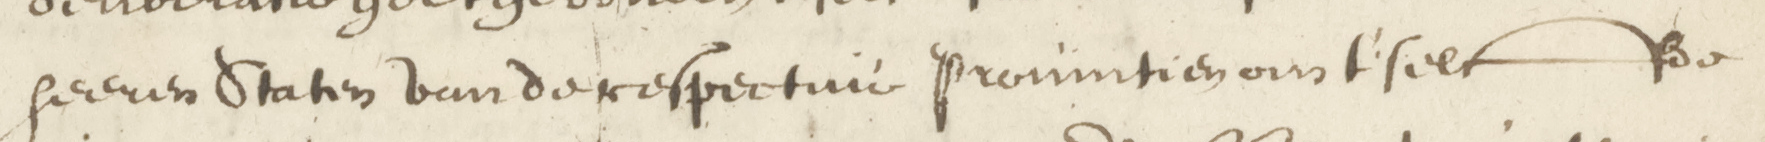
heeren Staten van de respectiue Prouintien om t'selffde
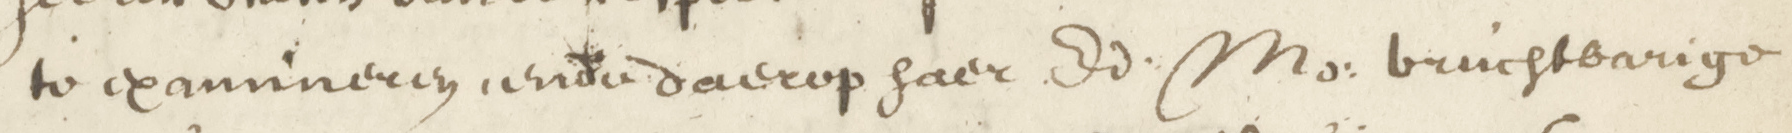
te examineren, ende daerop haer Ed:Mo: vruchtbarige
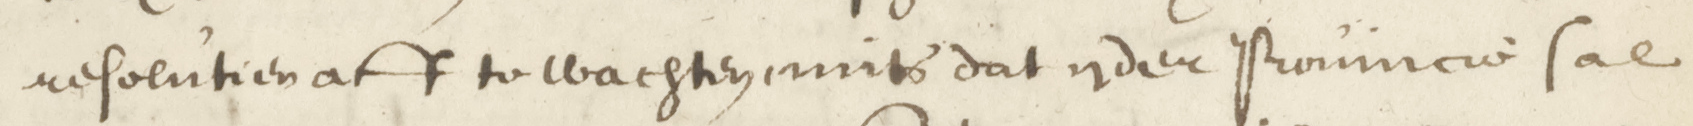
resolutien aff te wachten, mits dat yder Prouincie sal
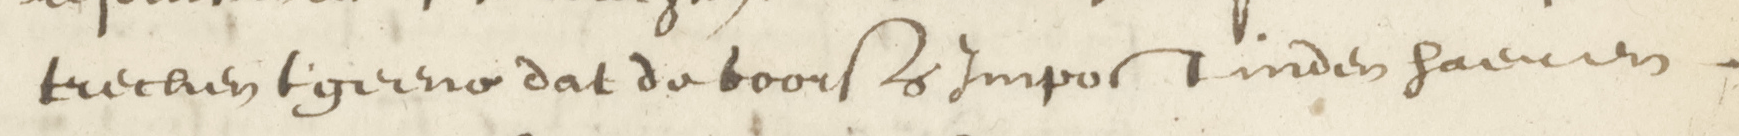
trecken t‛geene dat de voors Impost inden haeren
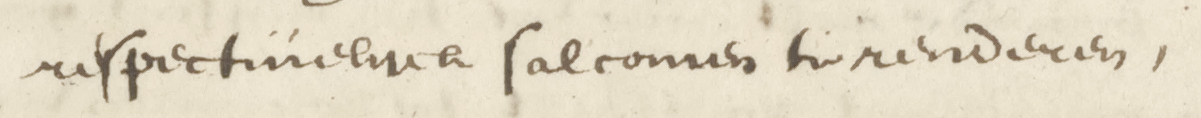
respectivelyck sal comen te renderen.
